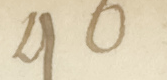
46
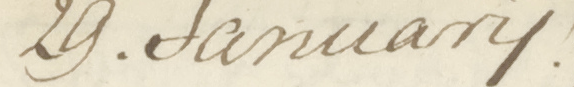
29. Januarij.
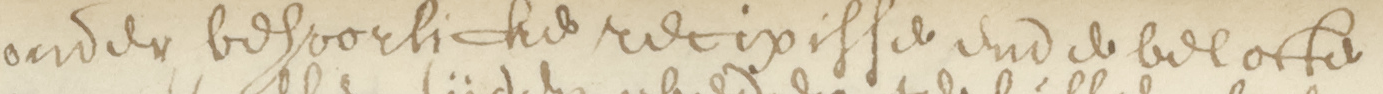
onder behoorlicke recipisse ende belofte
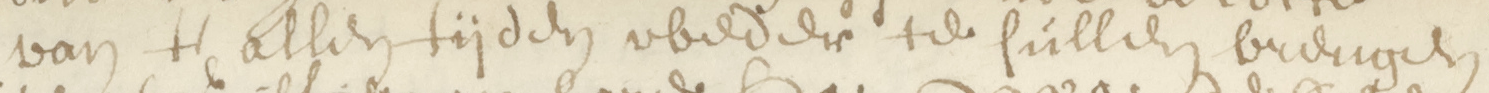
van t' allen tijden weder te sullen brengen
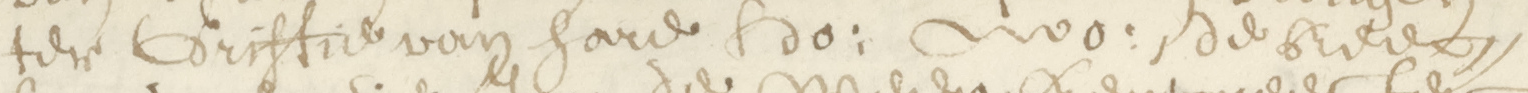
ter Griffie van hare Ho:Mo: de Reec„
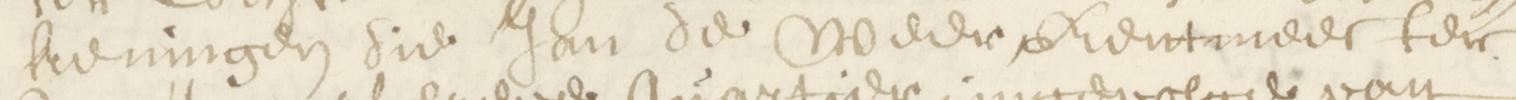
keningen die Jan de Weer Rentmeester
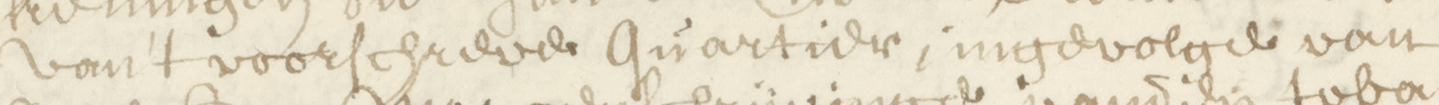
van 't voorschreve Quartier, ingevolge van
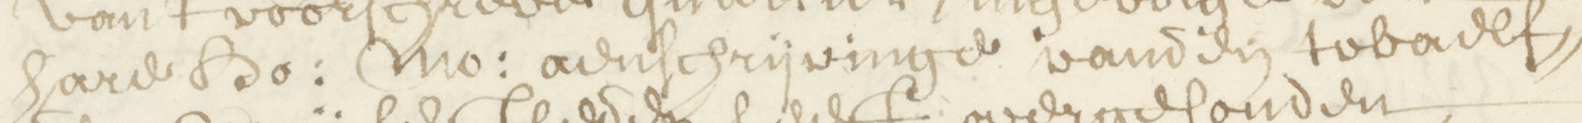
hare Ho:Mo: aenschrijvinge vanden twaelf„
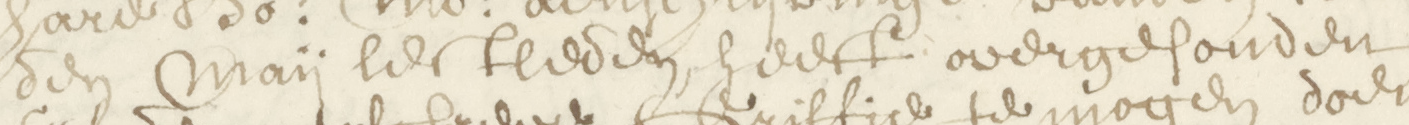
den maij lestleden, heeft overgesonden
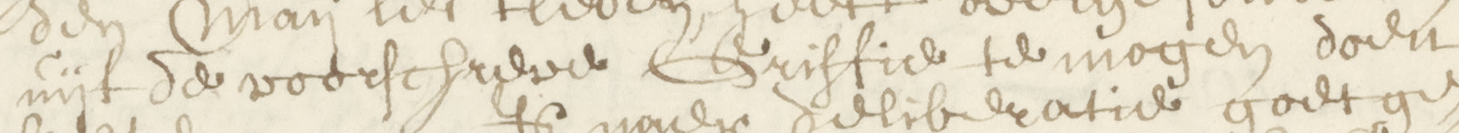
uijt de voorschreve Griffie te mogen doen
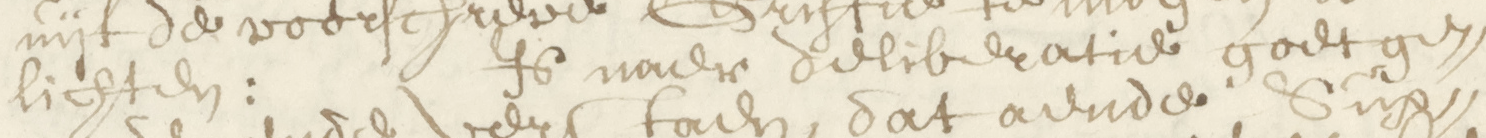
lichten: Is naer deliberatie goetge„
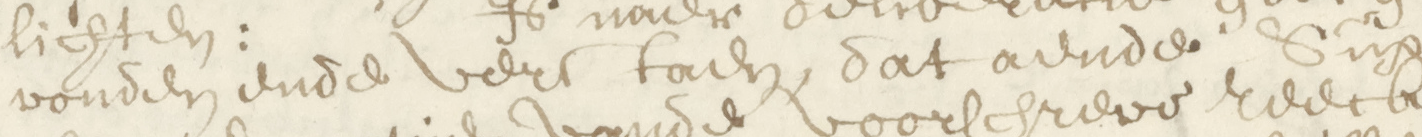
vonden ende verstaen, dat aende Sup„
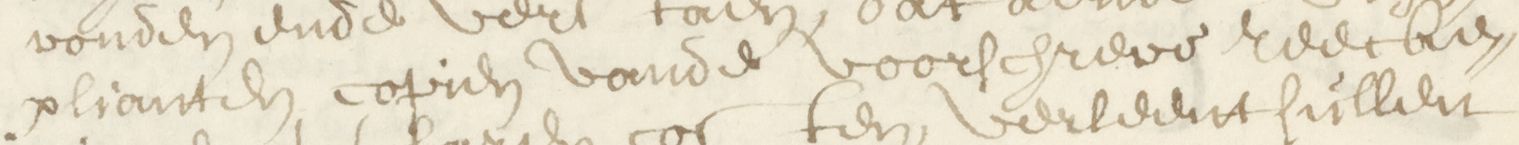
plianten copien vande voorschreve reecke„
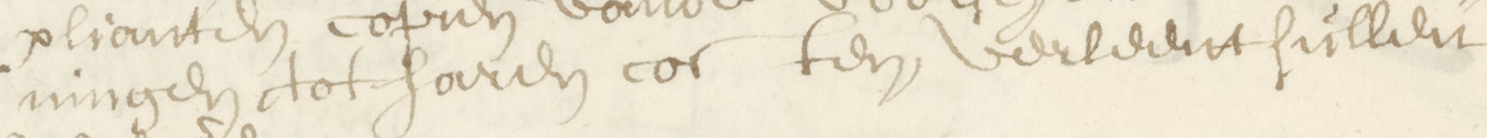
ningen tot haren costen, verleent sullen
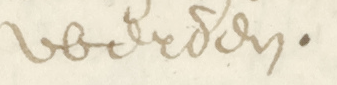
werden.
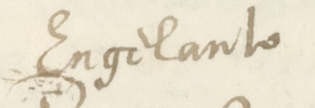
Engelants
